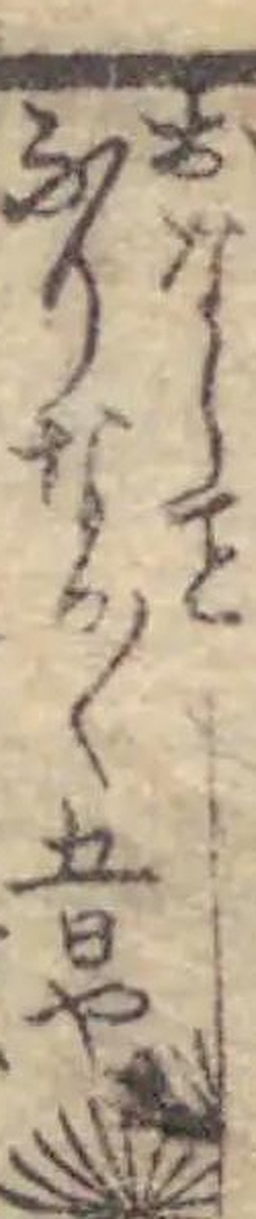ふりなか〳〵五日や
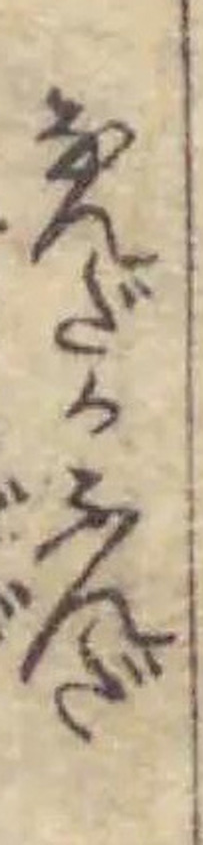なんだかふんだ
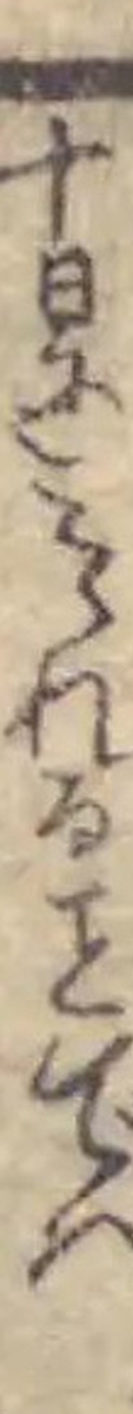十日にミられることでハ
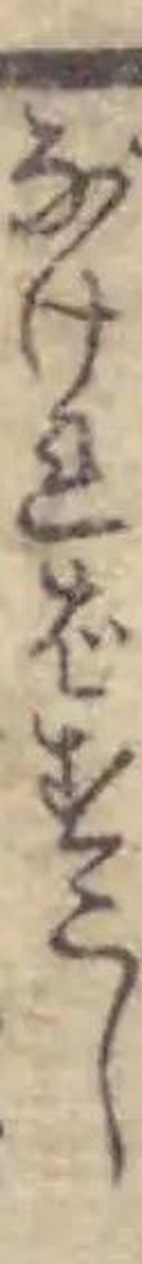なければすこし
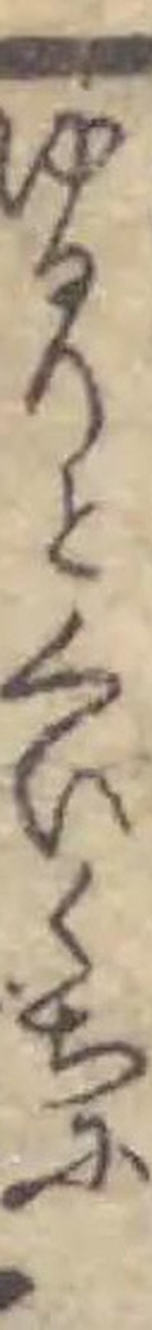ゆるりとくいくちに
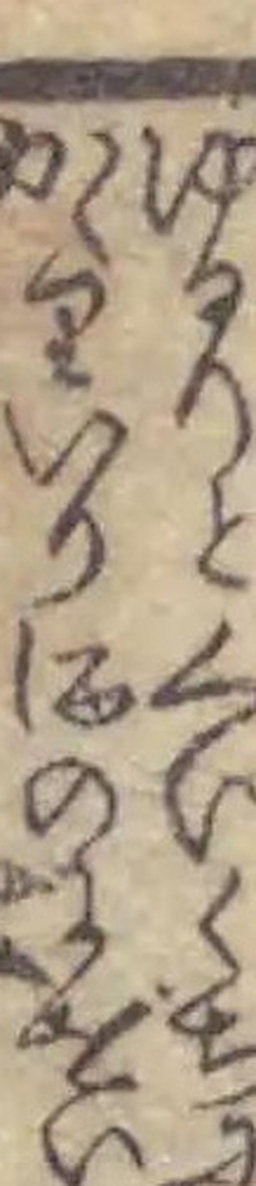かゝりいり酒のにをい
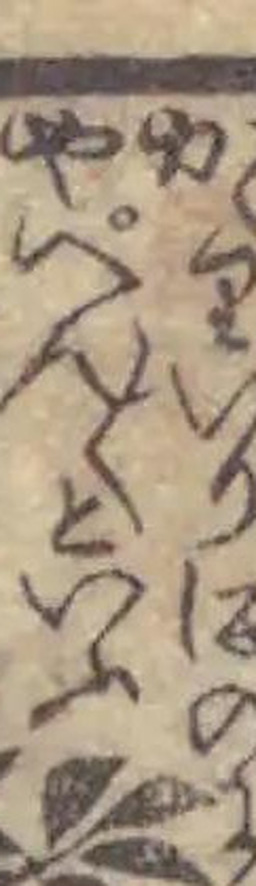やぺん〳〵といふ
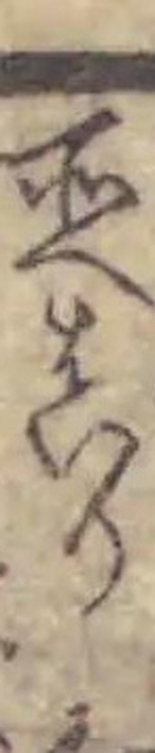所へはいり
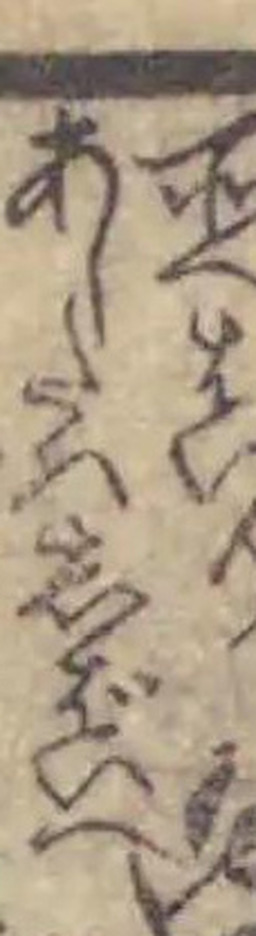あしたハしばいへ
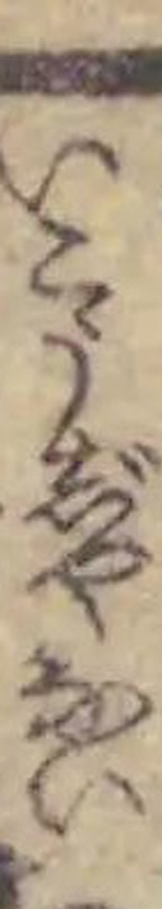いこうじやない
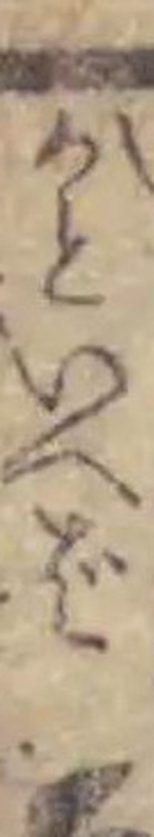かといへば
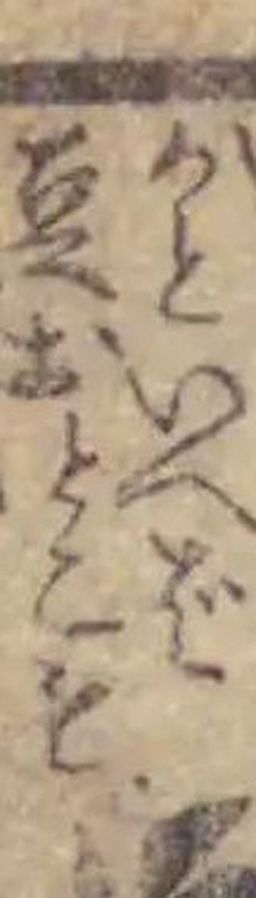豆おとこも

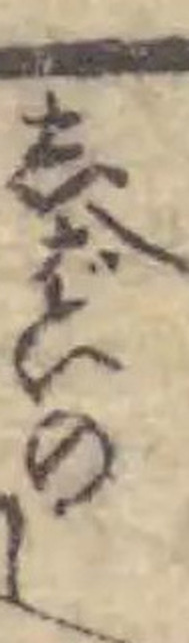しばいの
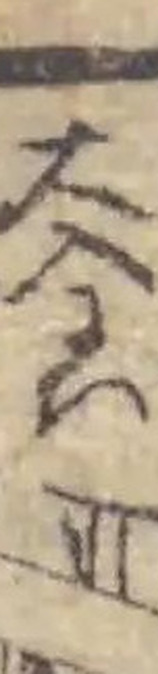大入にハ
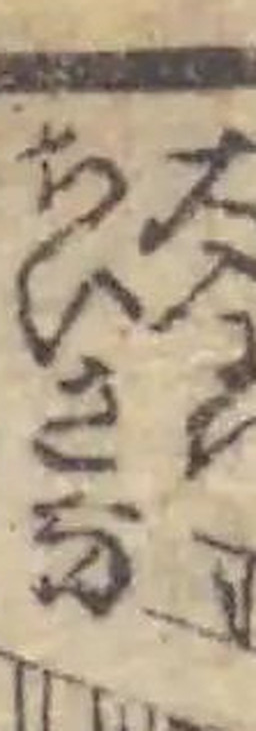ちいさな
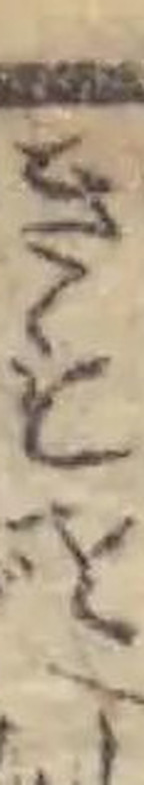きもを
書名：豆男江戸見物 2巻
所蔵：国立国会図書館 National Diet Library, JAPAN
